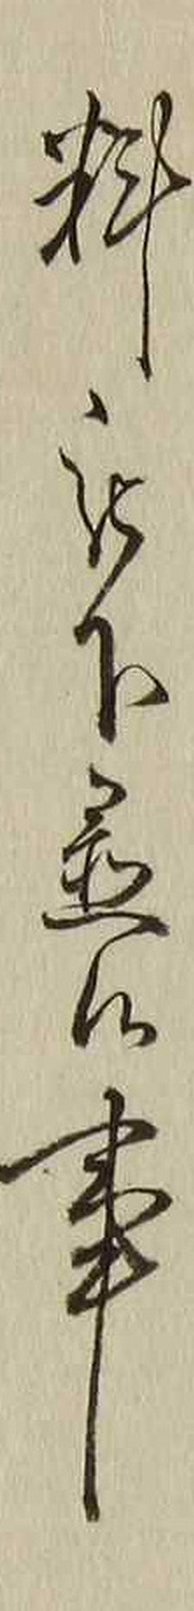料被下置候事
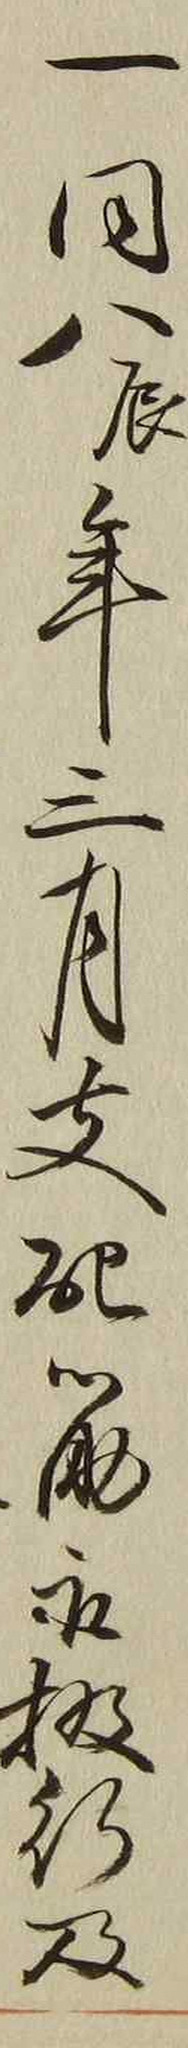一同八辰年三月支配筋取扱行及
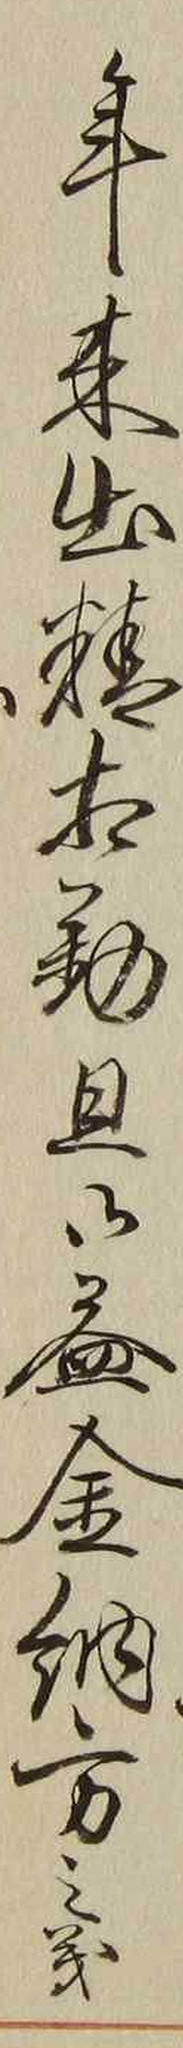年来出精相勤且御益金納方之義
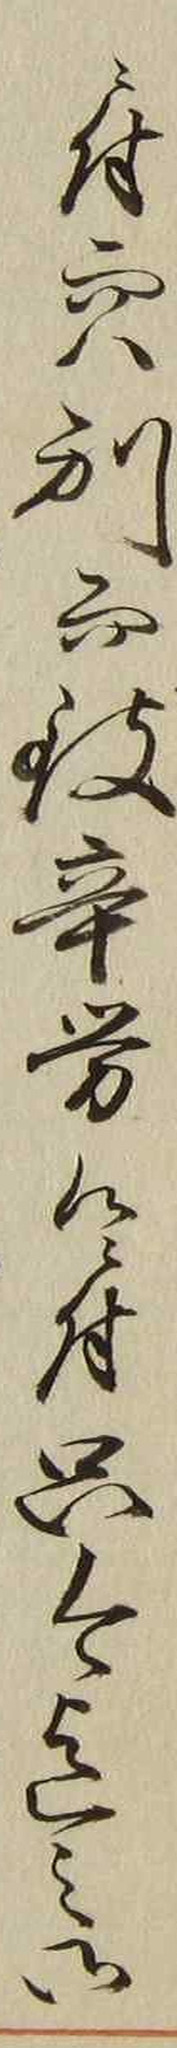ニ付而ハ別而致辛労候ニ付只今迄之御
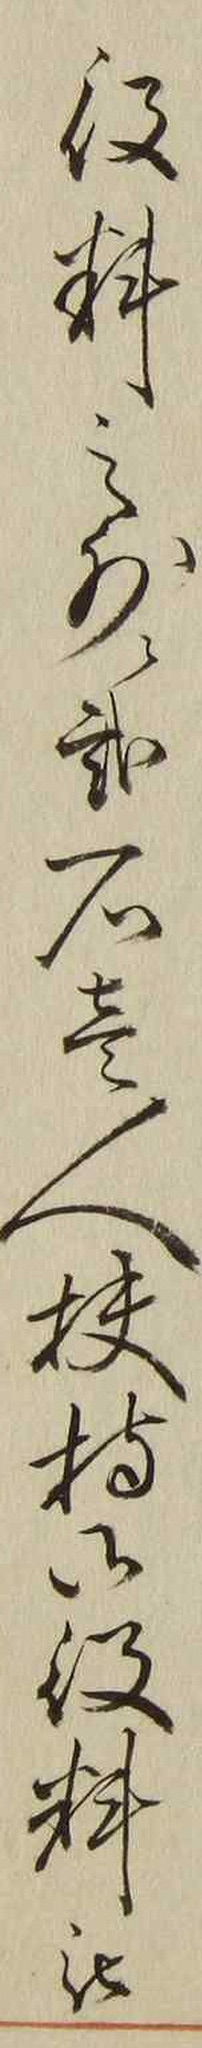役料之外ニ弐石壱人扶持御役料被

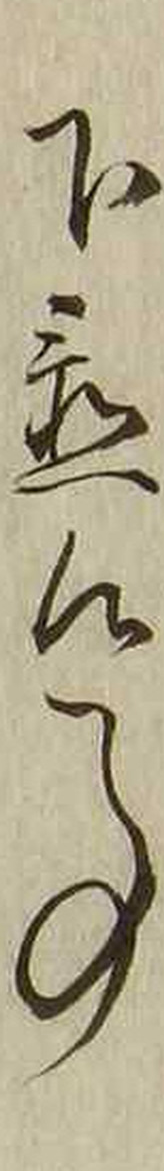下置候事
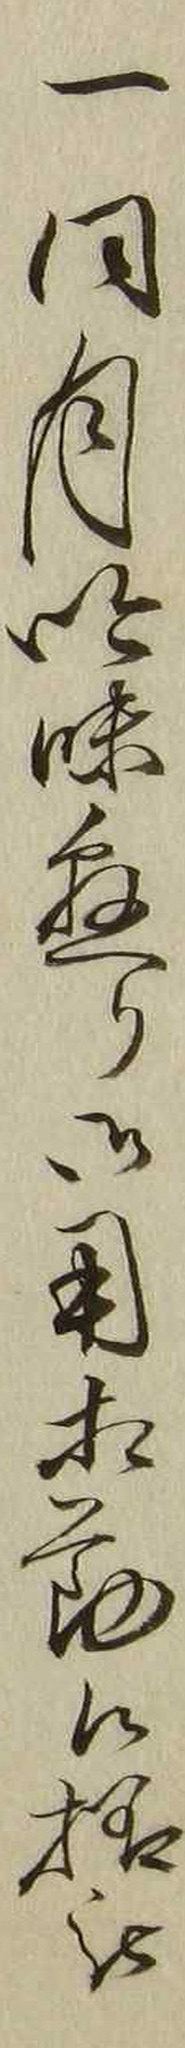一同月吟味懸り御用相勤候様被
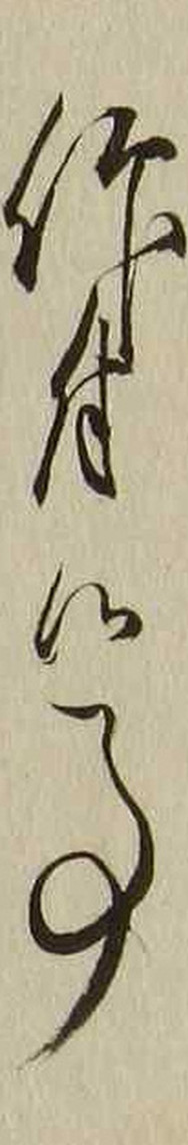仰付候事
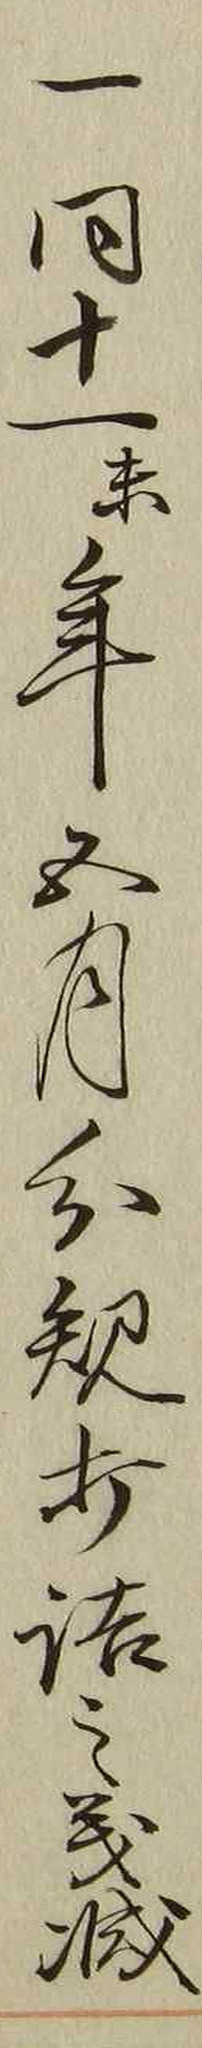一同十一未年五月分規打詰之義減
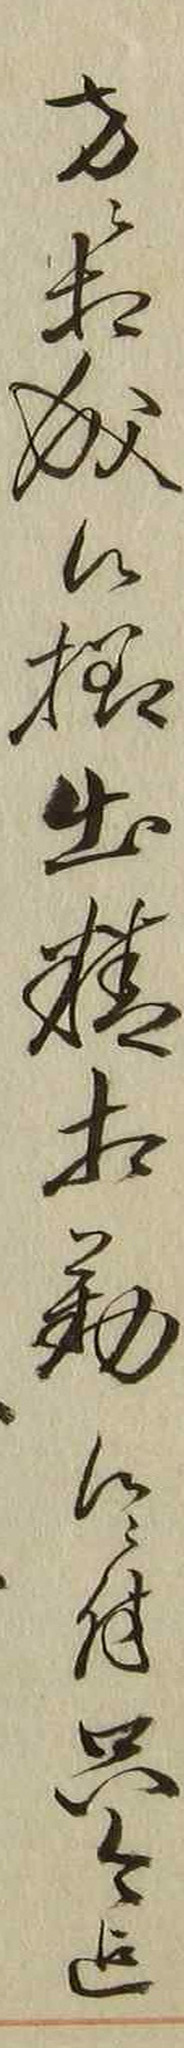方ニ相成候様出精相勤候ニ付只今迄
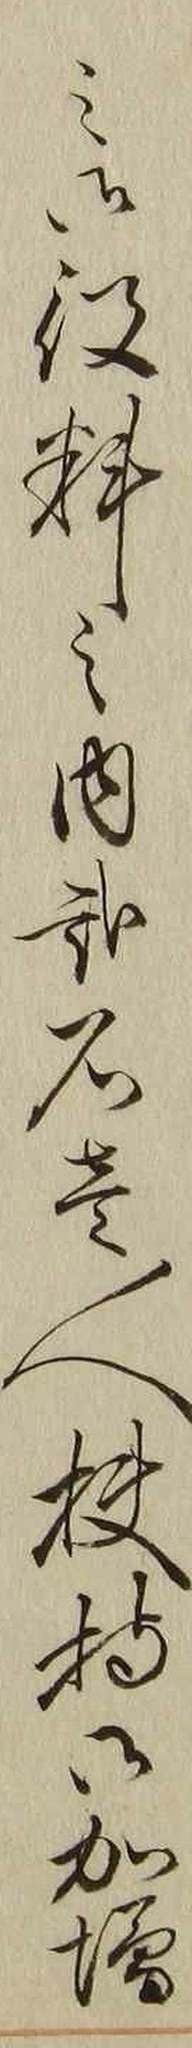之御役料之内弐石壱人扶持御加増
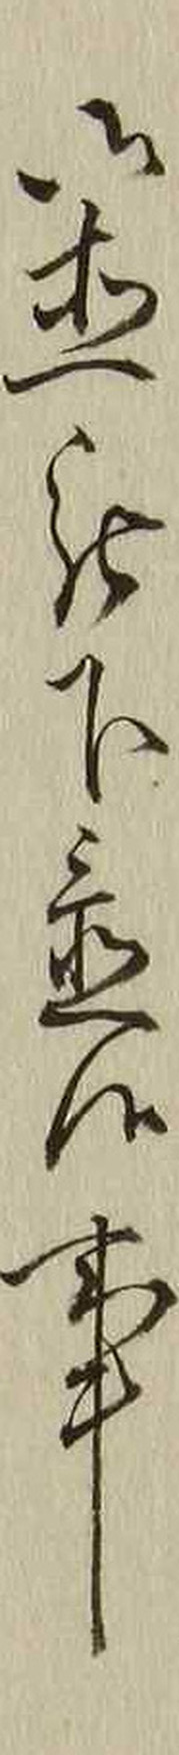御直被下置候事
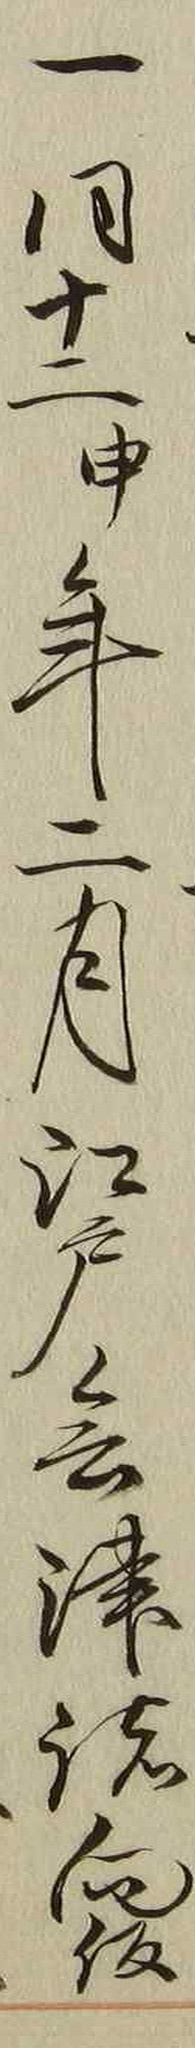一同十二申年二月江戸会津諸向仮
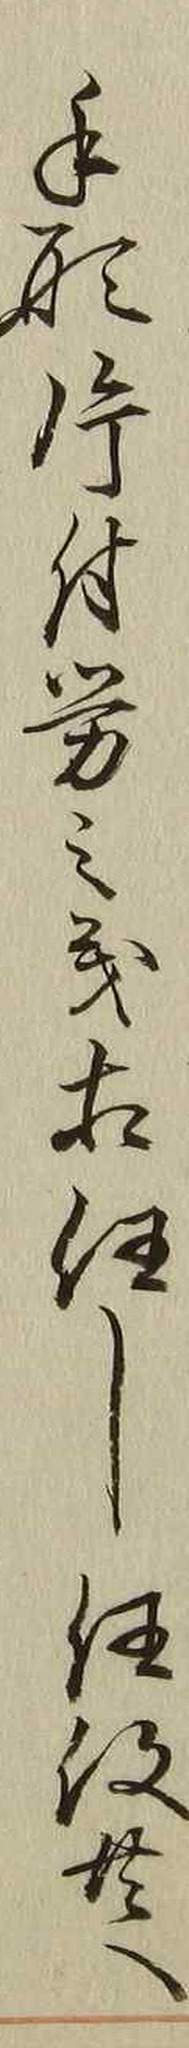手形片付労之義相任し任役共へ
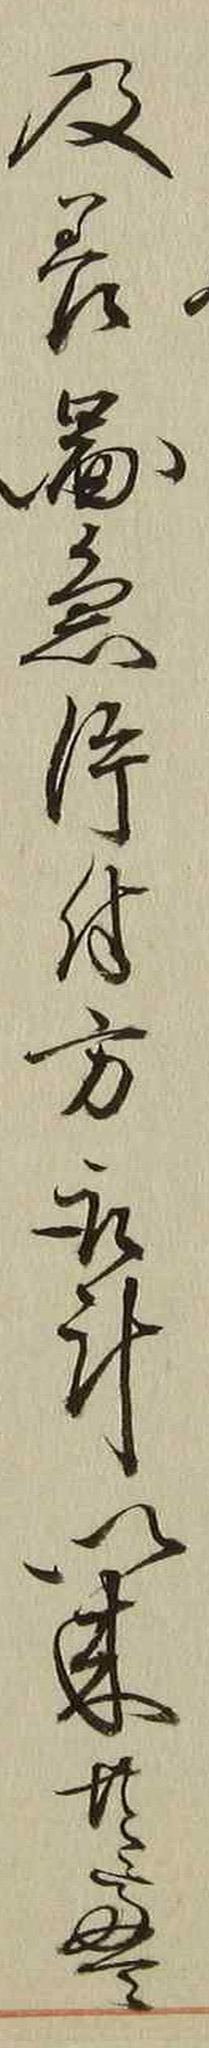及差図急片付方取計以来共ニ盈
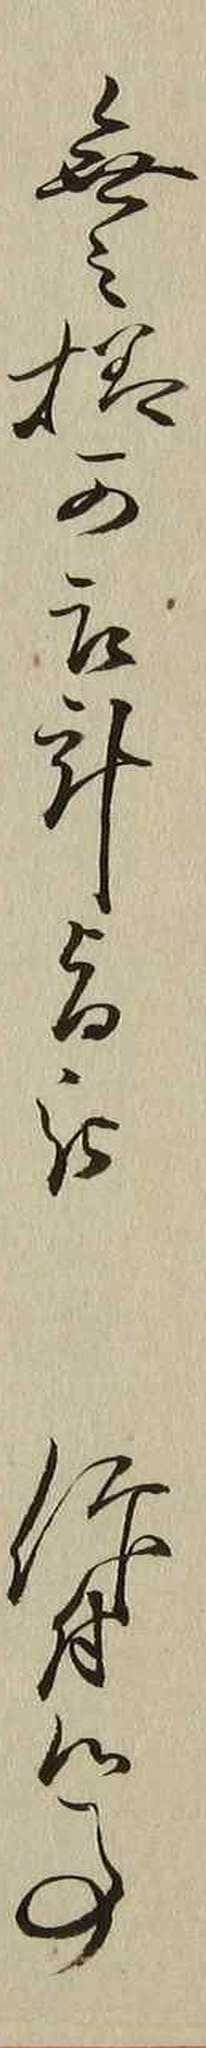無之様可取計旨被仰付候事
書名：諸士系譜　巻之57　ほ之部4
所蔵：会津若松市立会津図書館
